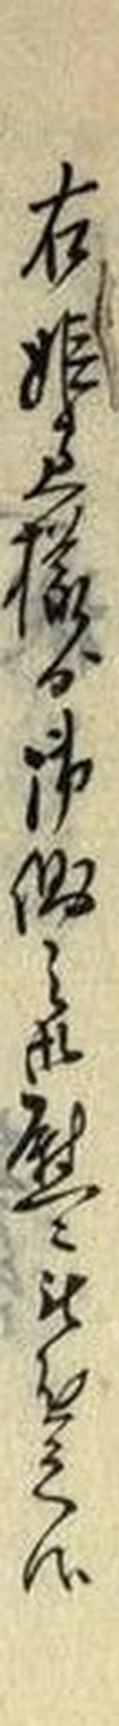右姫君様ゟ御側之御慰ニ被進之候
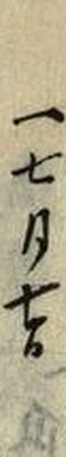一七月七日
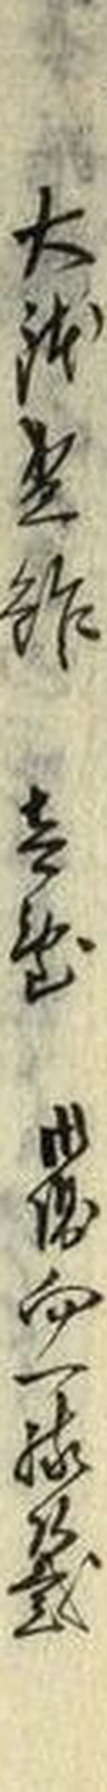大鉢盛鮓壱台御側向一統頂戴
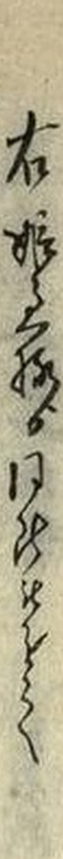右姫君様ゟ同断被進之
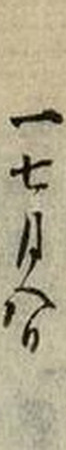一七月八日
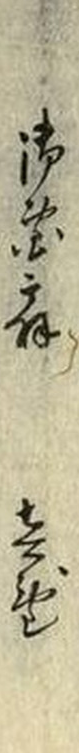御団扇壱台
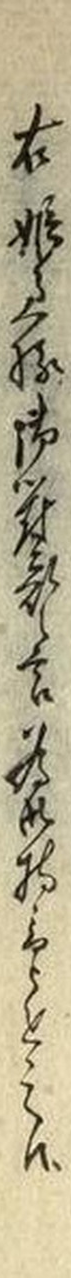右姫君様御対顔之節為御持ニ而被進之候
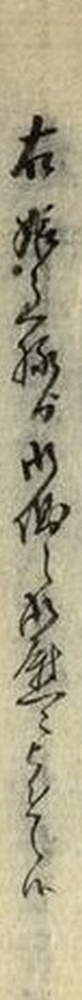右姫君様ゟ御側之御慰ニ被進之候
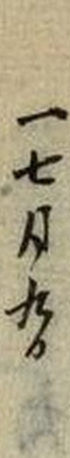一七月九日
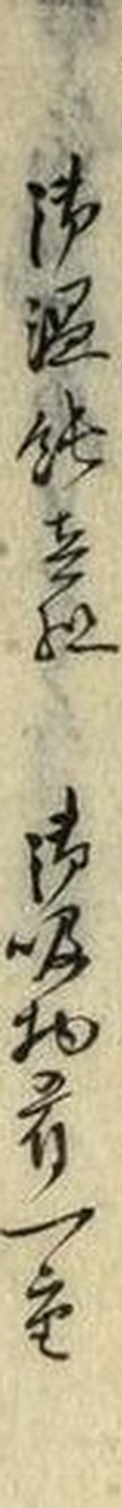御温飩壱組御吸物肴一重

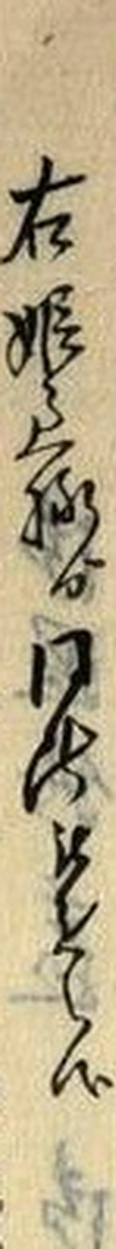右姫君様ゟ同断被進之候
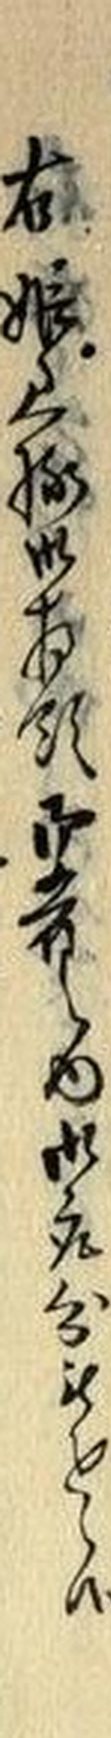右姫君様御拝領御肴之内御取分被被進之候
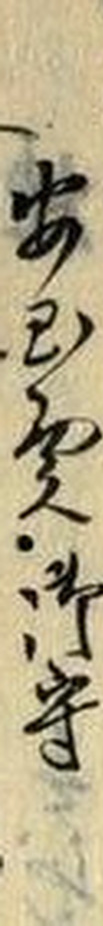安国殿御守
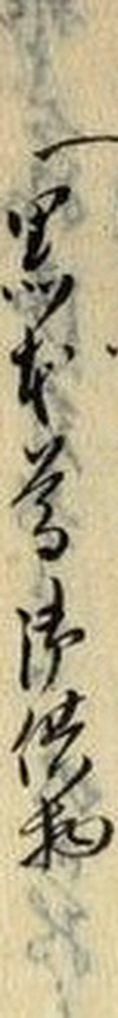黒本尊御供物
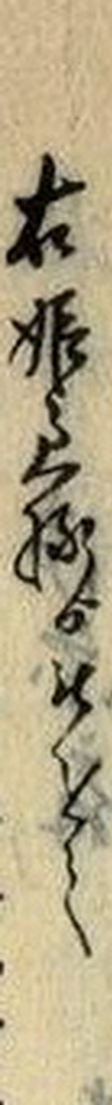右姫君様ゟ被進之
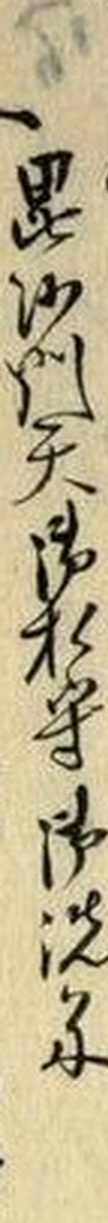毘沙門天御札守御洗米
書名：少傅日録抄（斉承付側向頭取日記、在府）
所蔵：福井県文書館 Fukui Prefectural Archives
